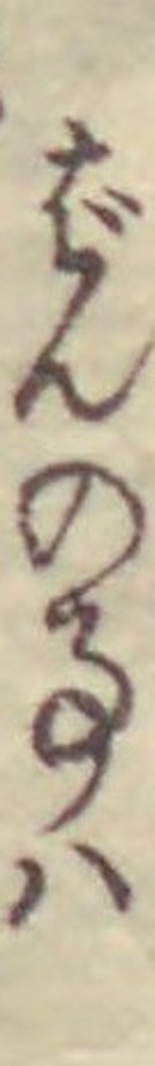ばんの事は
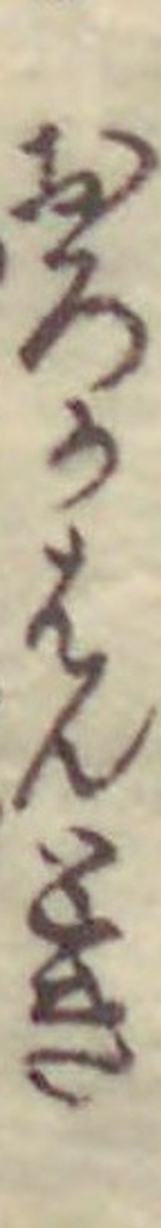おろかはんとき
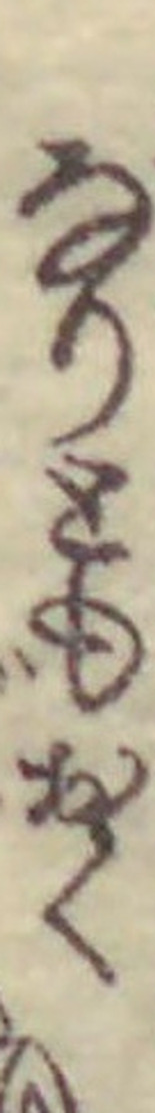なりともおく
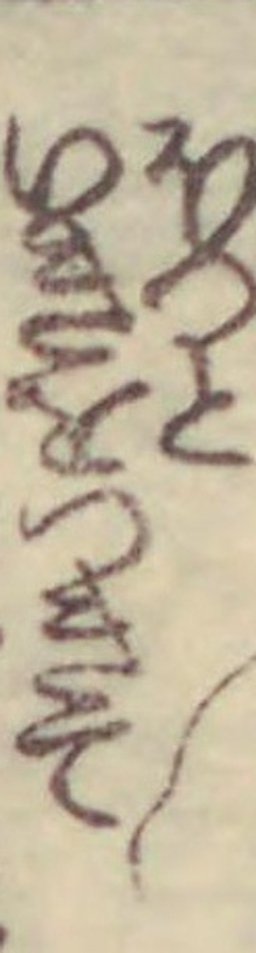いきをつきて
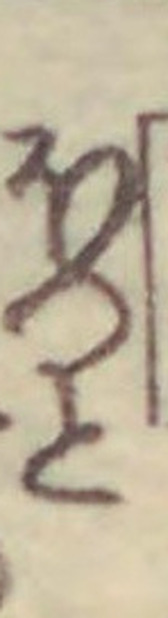ほつと
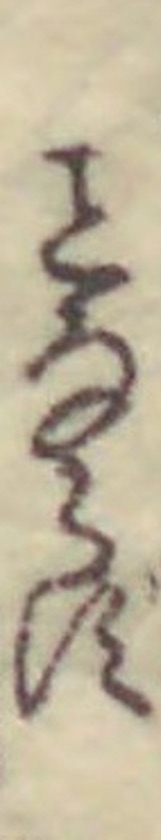ことならず
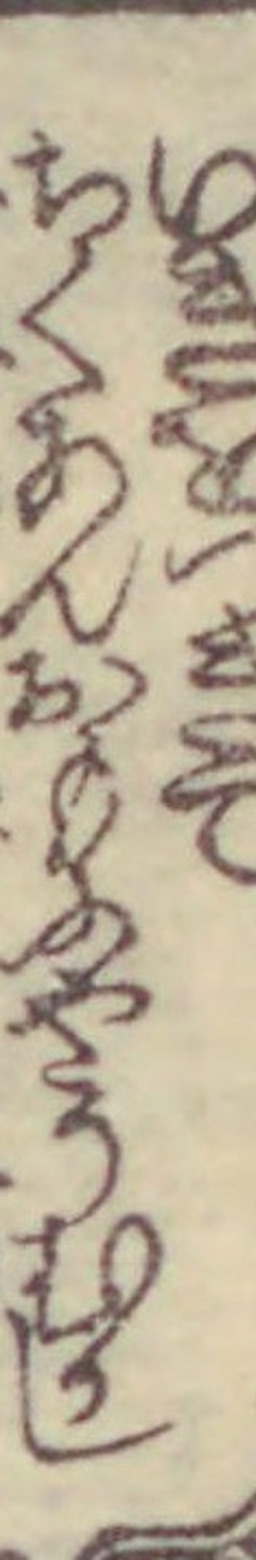ちくあんおもふやうむかし
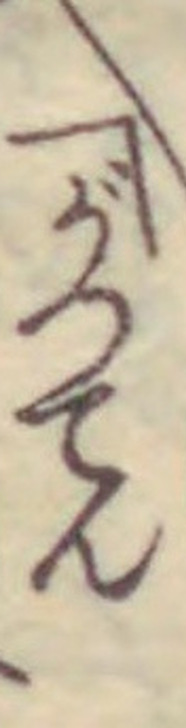〽がつてん
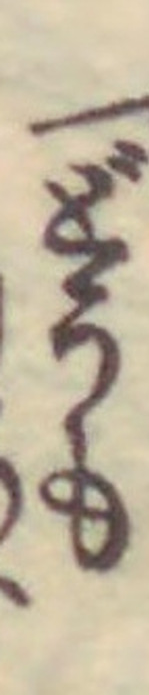〽どうも
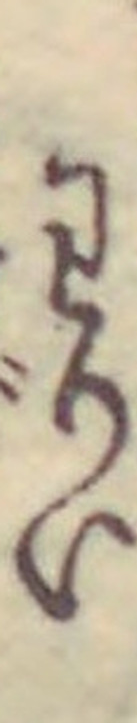わりい
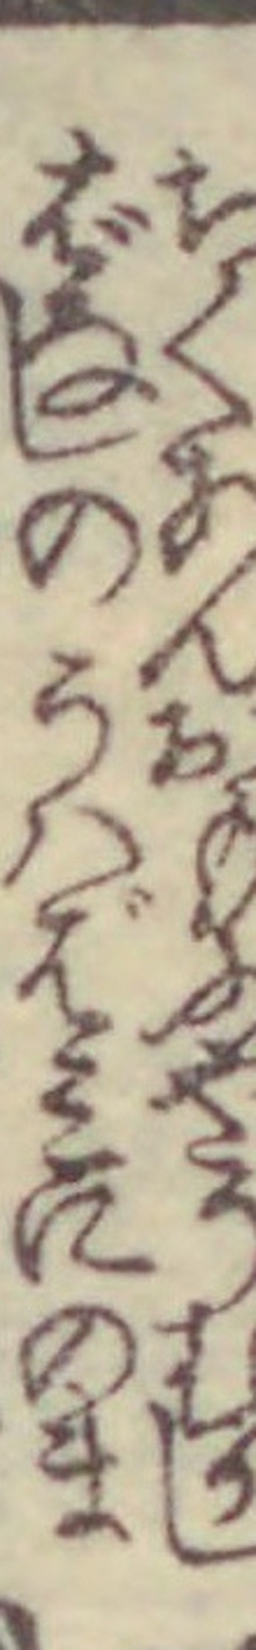ばなしのうはばみにのま
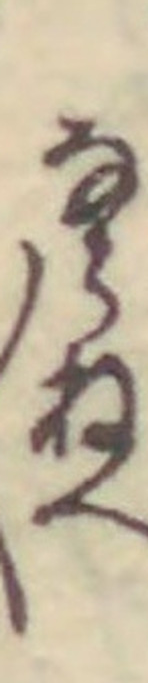ならねへ
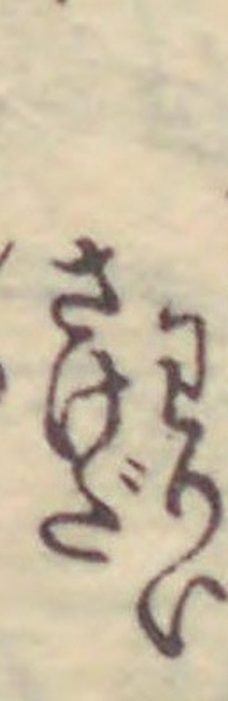さけだ
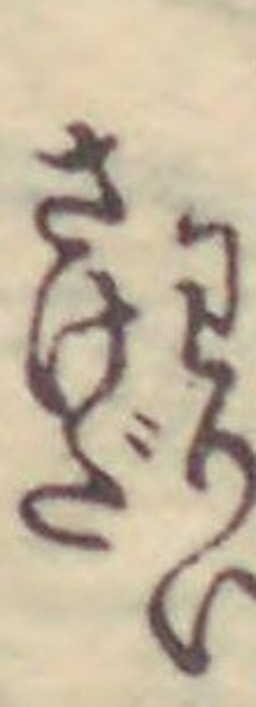さけだ
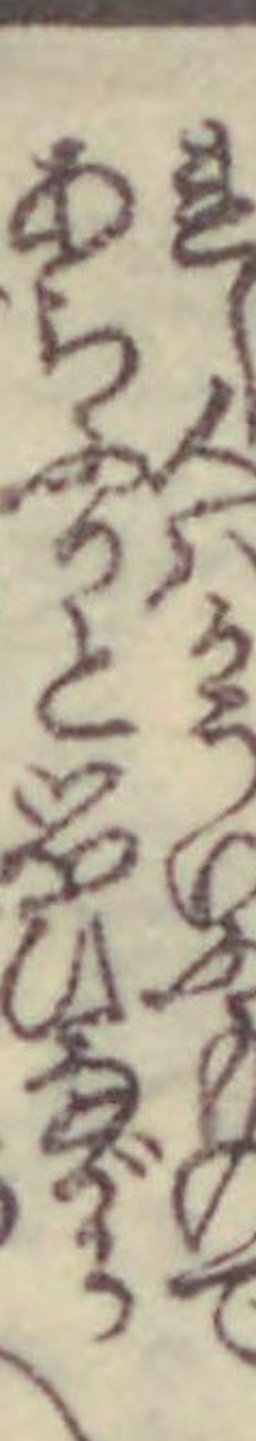あらふかと思ひながら
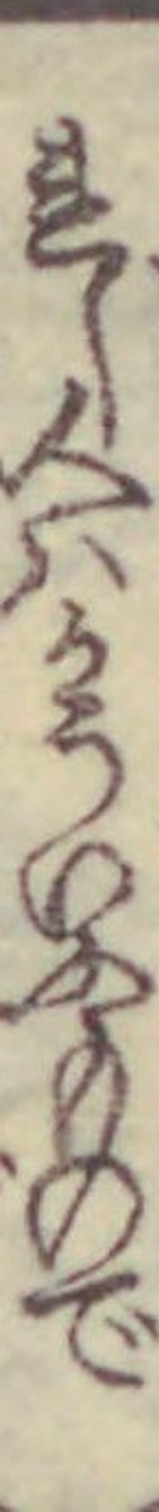れし人はかういふもので
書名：腹内窺機関 2巻
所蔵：国立国会図書館 National Diet Library, JAPAN
